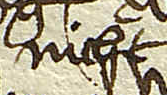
nicht
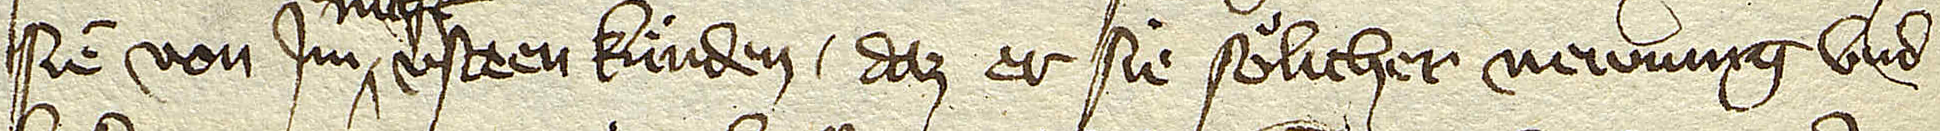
ſie von Im v*ſteen künden / daʒ er ſie ſölicher newung vnd
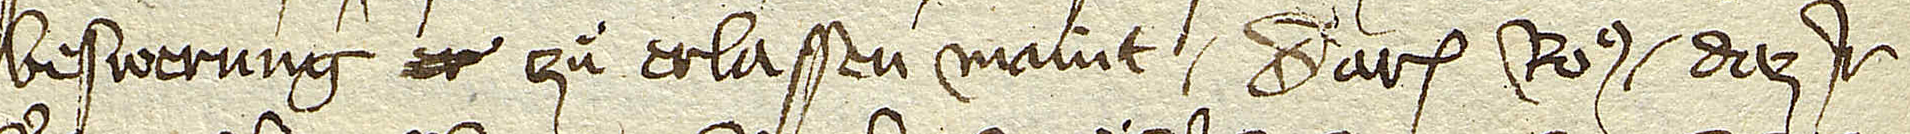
beſwerung er cʒü erlaſſen maint / Dar* Ro* / daʒ Ir
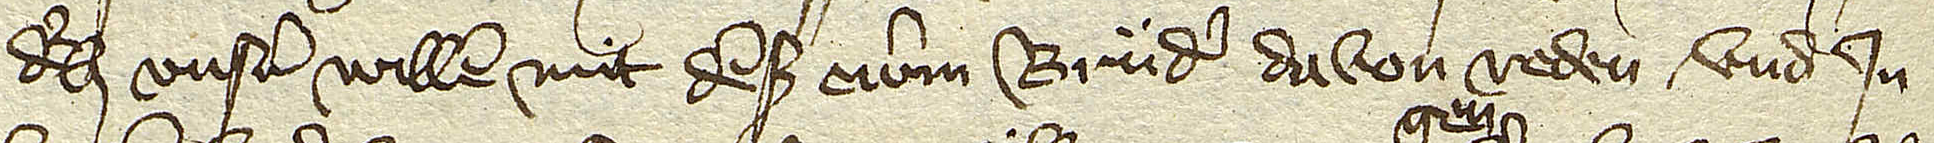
d*h vnſn* wille* mit de*ſ* ew*m Brüd* davon reden / vnd In
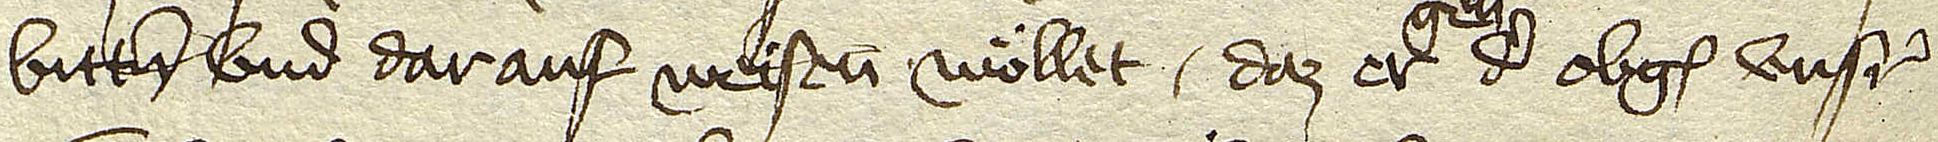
bittn* vnd darauf weiſen wöllet / daʒ er d* obg* vnſr*
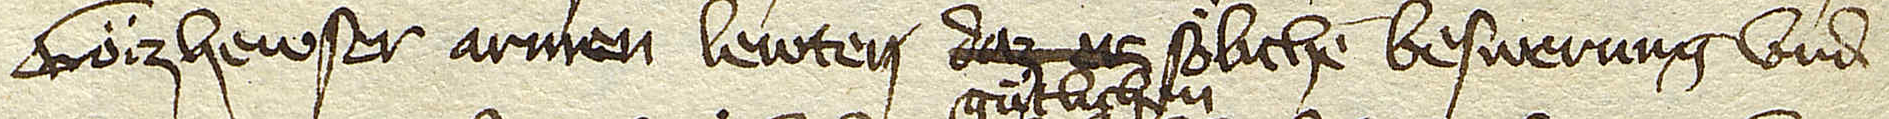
Göcʒhewſer armen lewten / daʒ er ſöliche beſwerung vnd
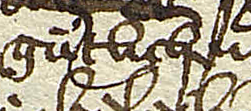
gütlichen
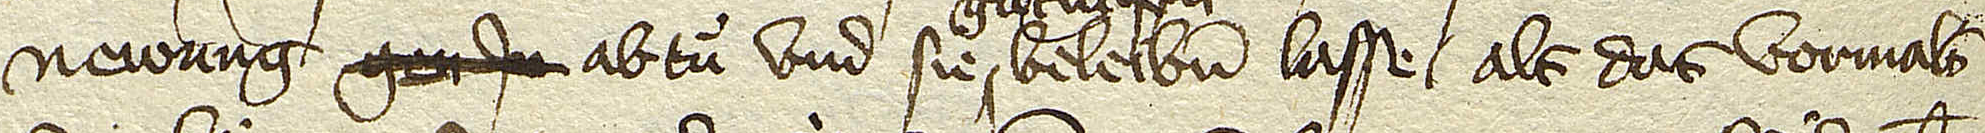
Newung gen In abtü vnd ſie beleibn* laſſe* / als das vormals
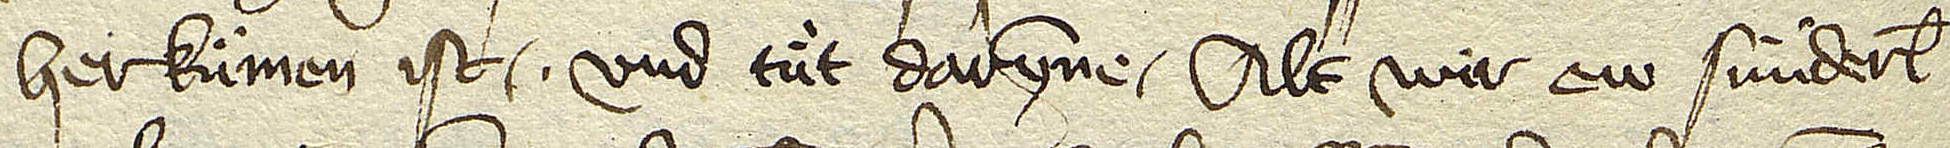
herkümen iſt /. vnd tüt daryne* / Als wir ew ſünderl*
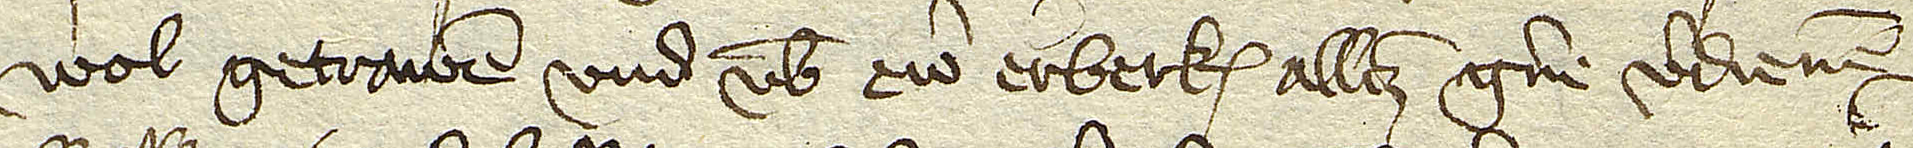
wol getrawe* vnd vb* ew* erberk* allcʒ* g*ne v*diene*
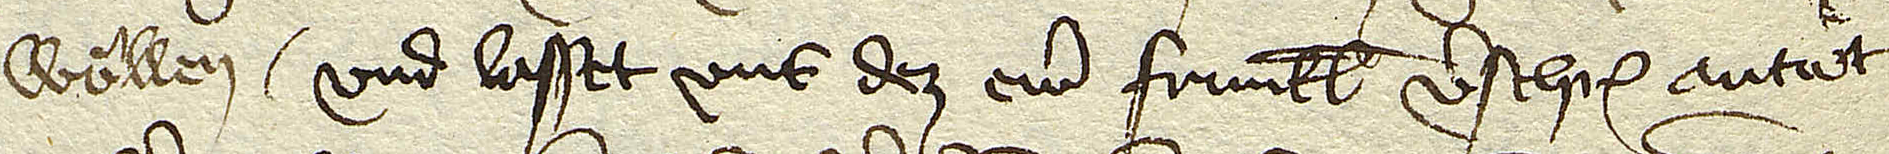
wöllen / vnd laſſet vns deʒ ew* fruntl* v*ſchr* antwt*
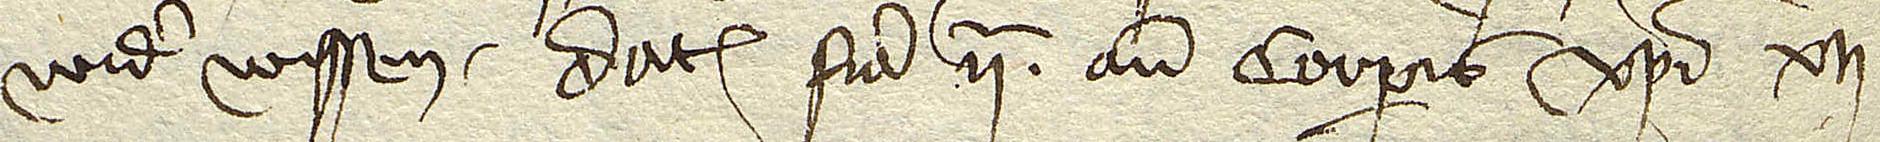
wid* wiſſen / Dat* fia* ii* . an* Corpis xpi* xii*
